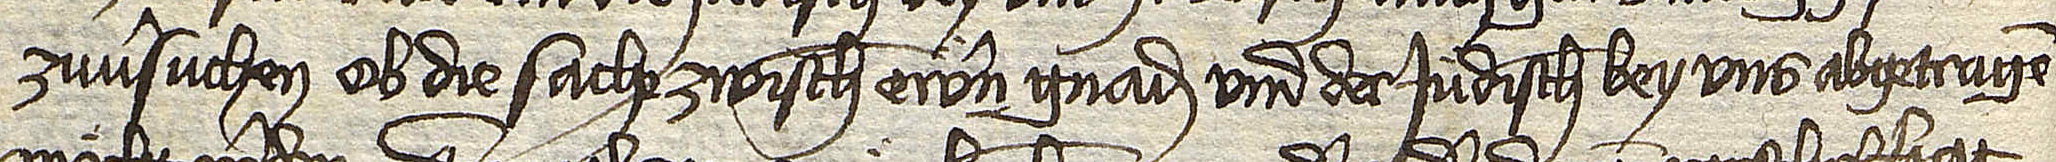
ʒuu*ſuchen Ob die ſache ʒwiſch* eẅ*n gnad* vns der Iüdiſch* bey vns abgetrage*
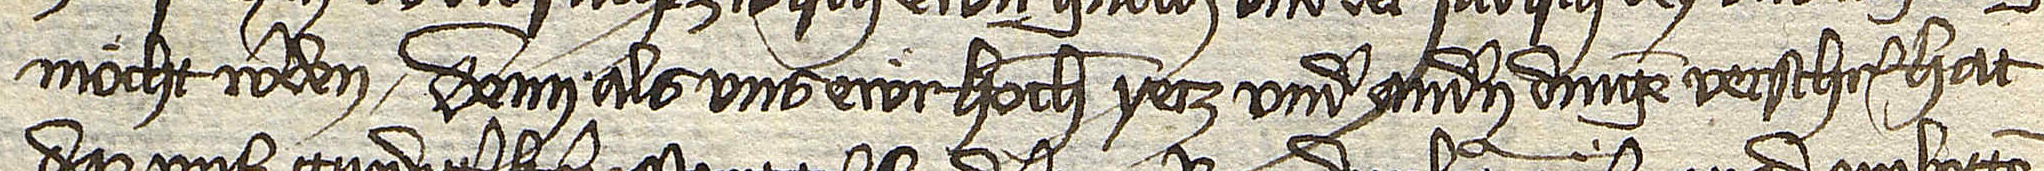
möcht w*den / Denn . als vns eẅr hoch* yecʒ vnd* and*n dinge* verſchr* hat
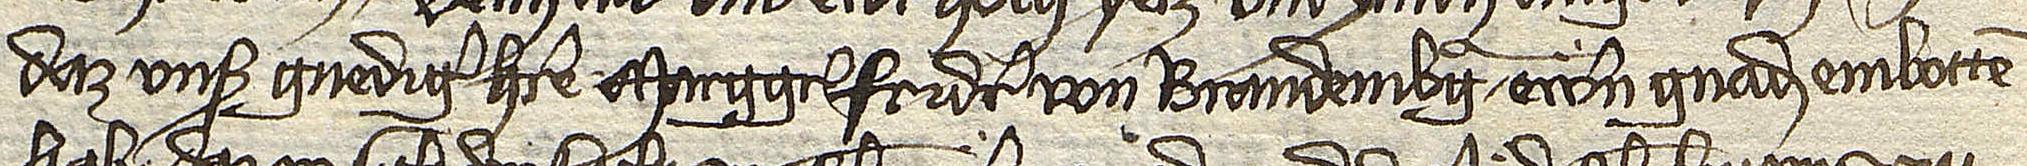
daʒ vnſ* gnedig* h*re . Marggr* fridr* von Brandenb*g / eẅ*n gnad* embotte*
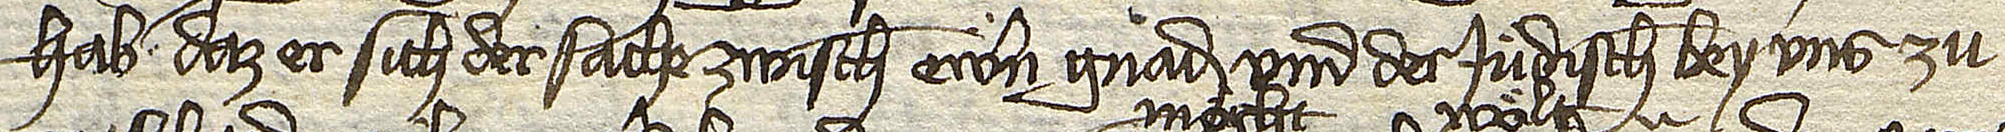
hab . daʒ er ſich der ſache ʒwiſch* eẅ*n gnad* vnd der Iüdiſch* bey vns ʒu
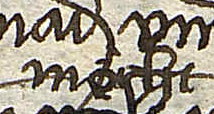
möcht
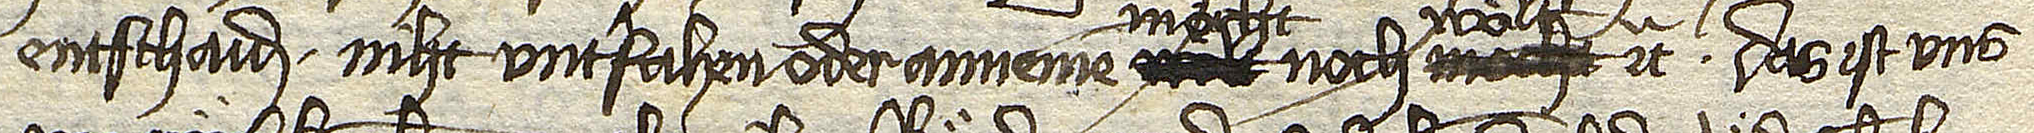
entſchaid* / niht vnt*fahen oder anneme* wölt noch mocht ec* . Das iſt vns
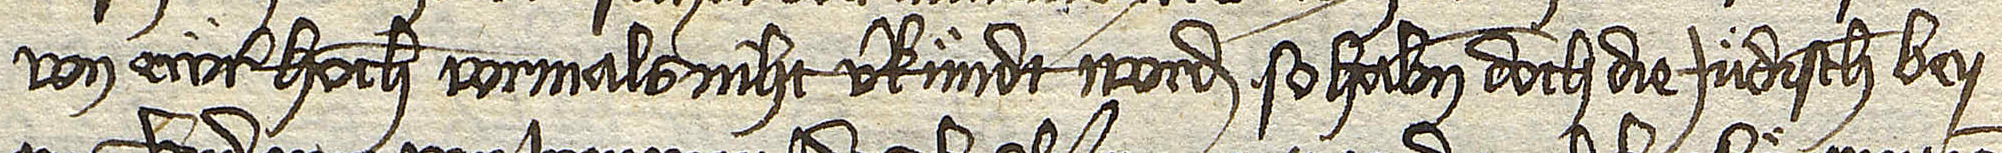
von eẅr* hoch* vormals niht v*kündt word* . ſo habn* doch die Iüdiſch* bey
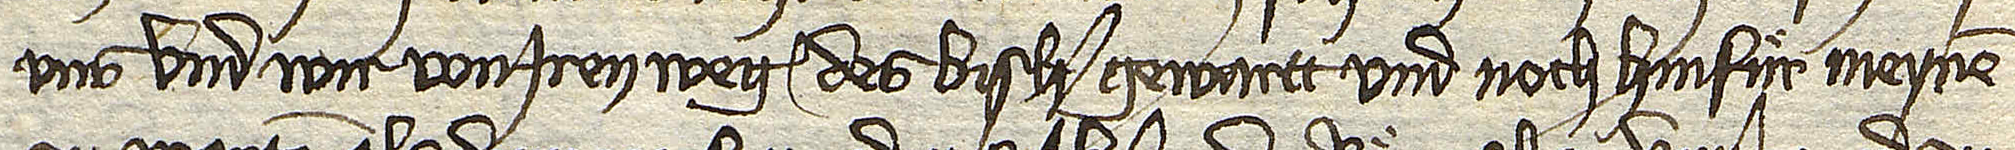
vns vnd wir von Iren weg* des biſh* gewartt vnd noch hinfür meyne*
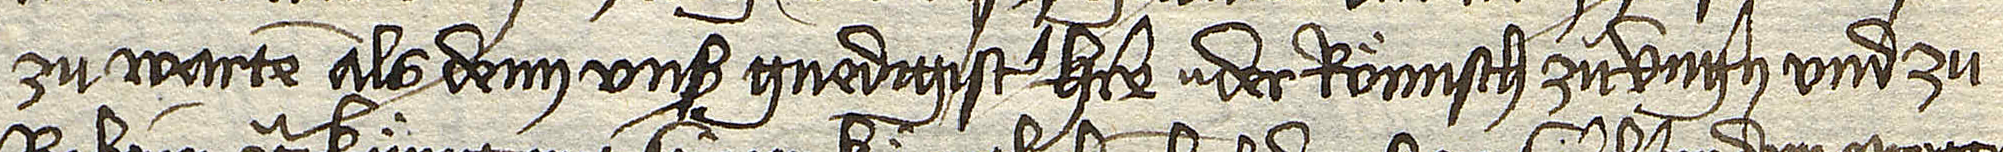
ʒu warte* als denn vnſ* gnedigiſt* h*re ~ der Römiſch ʒu Vng*n vnd ʒu
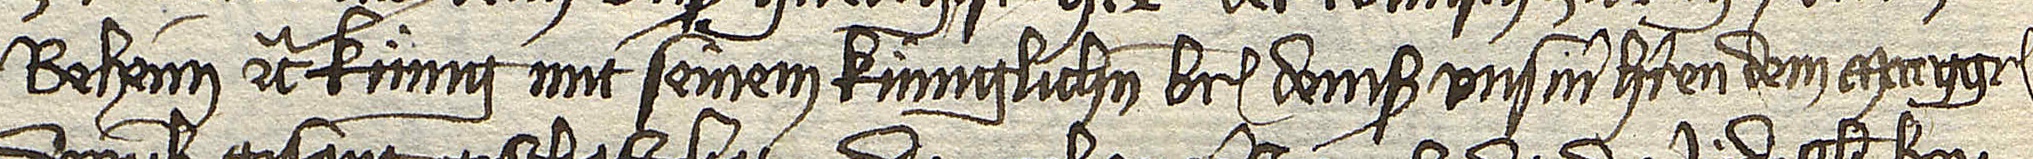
Beheim ec* künig mit ſeinem küniglichn* br* demſ* vnſm* h*ren dem Marggr*
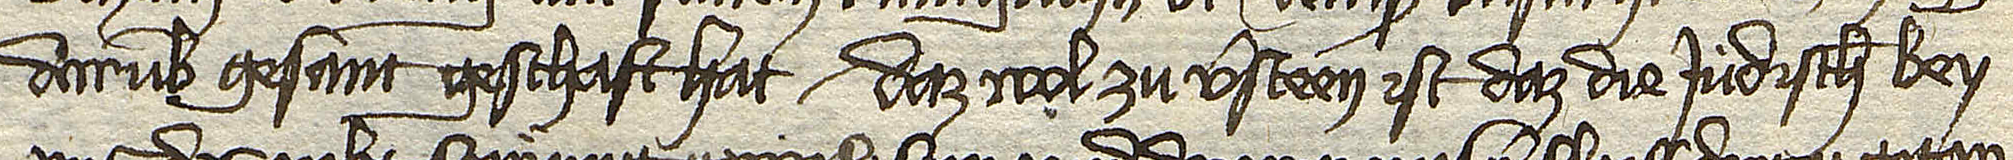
darub* geſant geſchaft hat / Daʒ wol ʒu v*ſteen iſt daʒ die Iüdiſch* bey
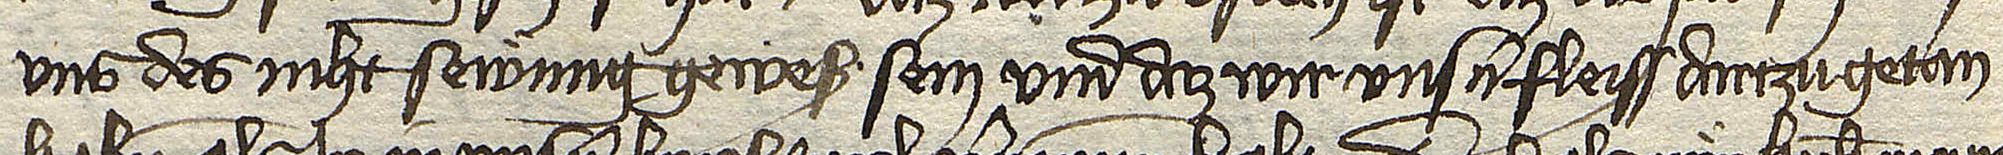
vns des niht ſeẅmig geweſ* ſein vnd daʒ wir vnſn* fleiſſ darcʒu getan
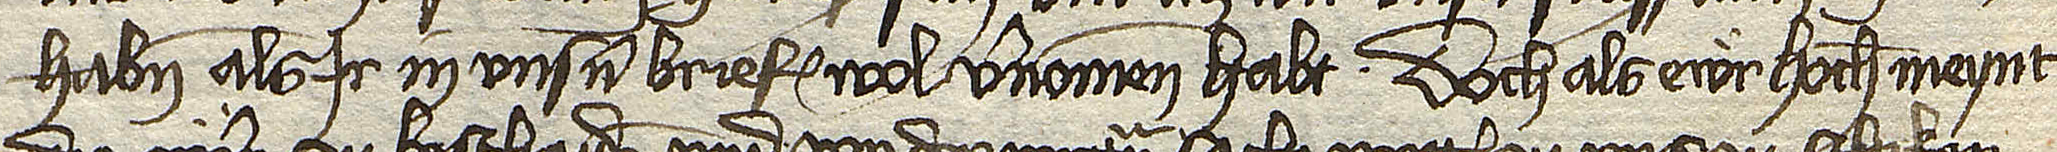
habn* als Ir in vnſn* brief* wol v*nomen habt . Doch als eẅr hoch* meynt
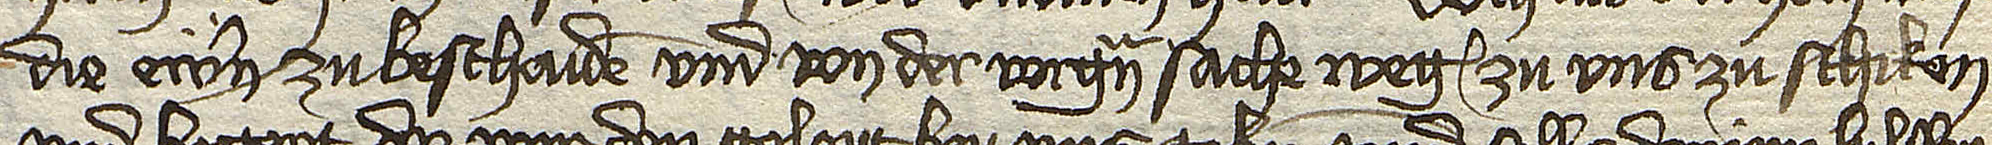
die eẅ*n ʒu beſchaide* vnd von der vorgn* ſache weg* ʒu vns ʒu ſchiken
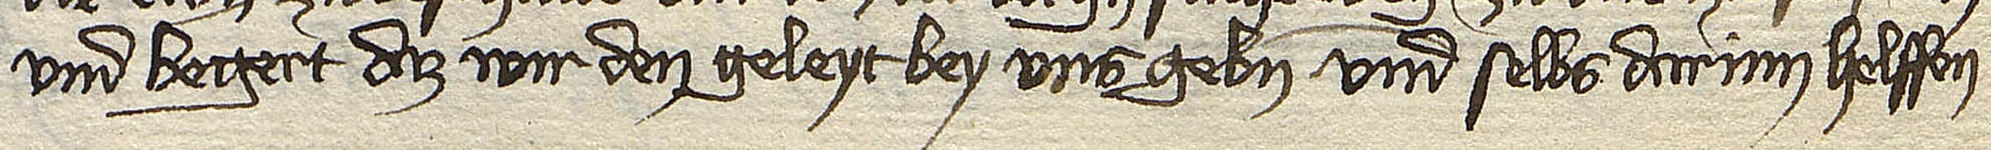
vnd begert daʒ wir den geleyt bey vns gebn* vnd ſelbs darinn helffen
